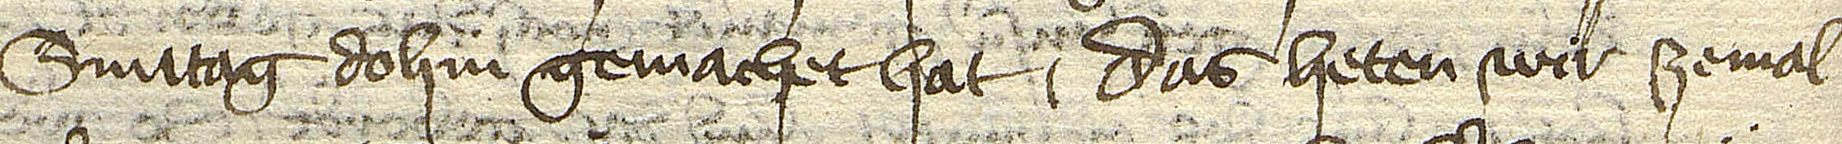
Suntag dohin gemacht hat / Das heten wir cʒemal
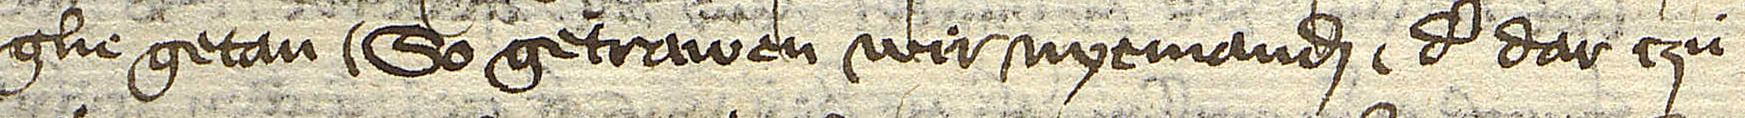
g*ne getan / So getrawen wir nyemand* / d* dar cʒü
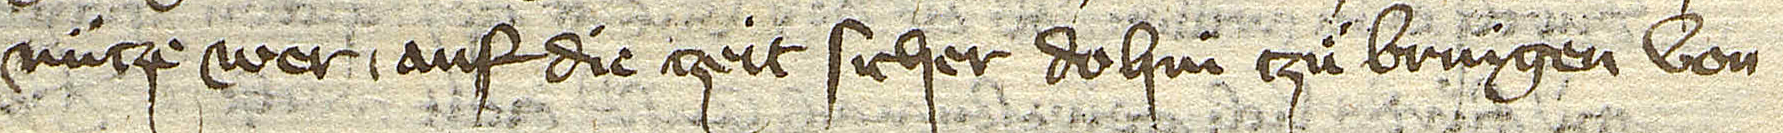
nücʒe wer / auf die cʒeit ſicher dohin cʒü bringen von
